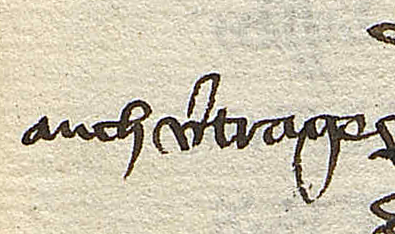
auch v*trage
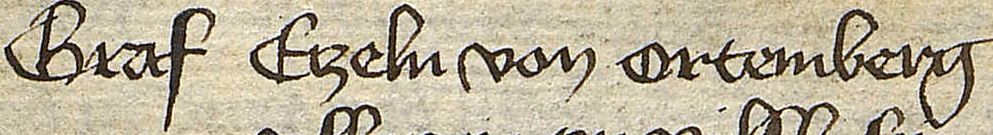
Graf Ecʒeln von Ortemberg
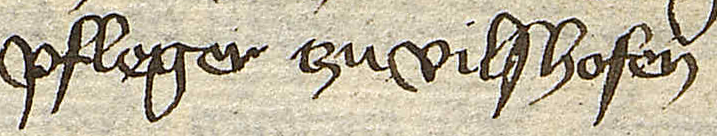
pfleger cʒu vilſhofen
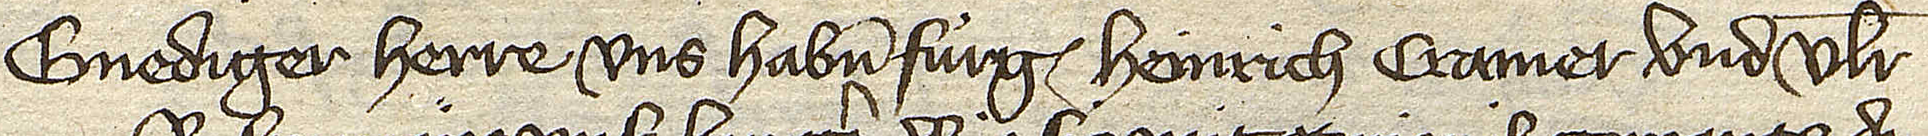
Gnediger herre vns habn* fürg* heinrich Cramer vnd vlr*
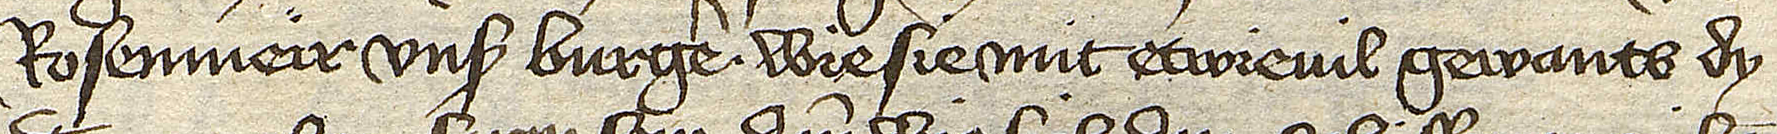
Roſenmeir vnſ* burge* . wie ſie mit etwieuil gewants dy
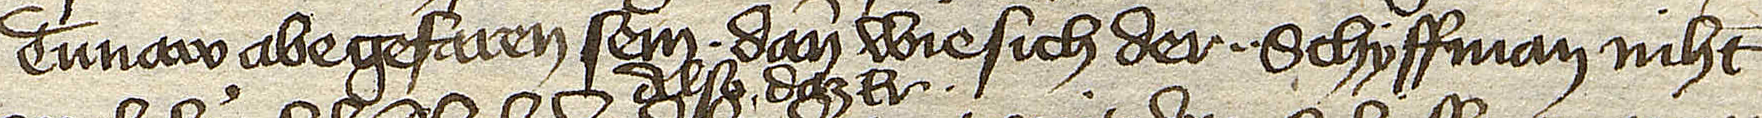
Tunaw abegefaren ſein . dan* wie ſich der ~ Schyffman niht
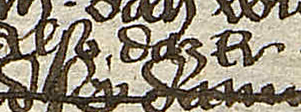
Alſo daʒ Er
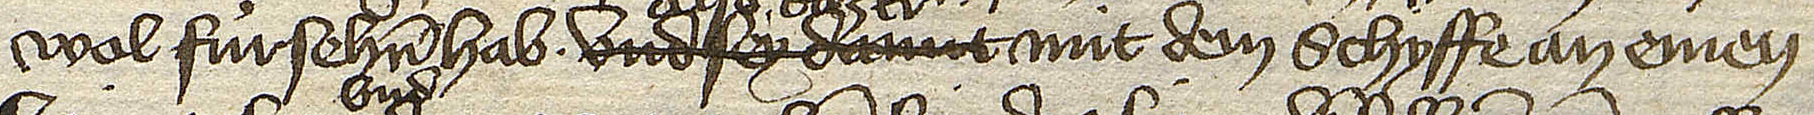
wol fürſehn* hab . Vnd ſey damit mit dem Schyffe an einen
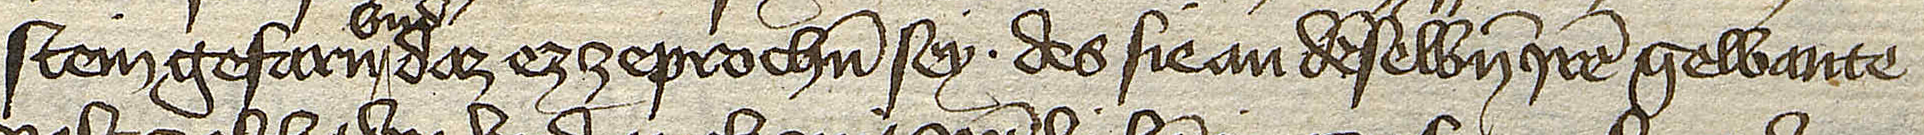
ſtein gefarn daʒ eʒ cʒeprochn* ſey . des ſie an de*ſelbn* Ire* gewante
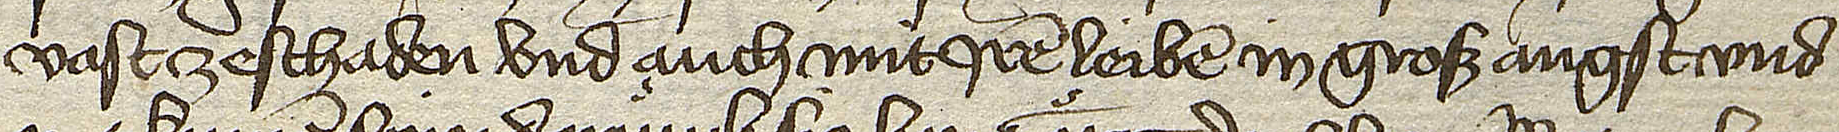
vaſt cʒeſchaden vnd auch mit Ire* leibe* in groſʒ angſt vnd
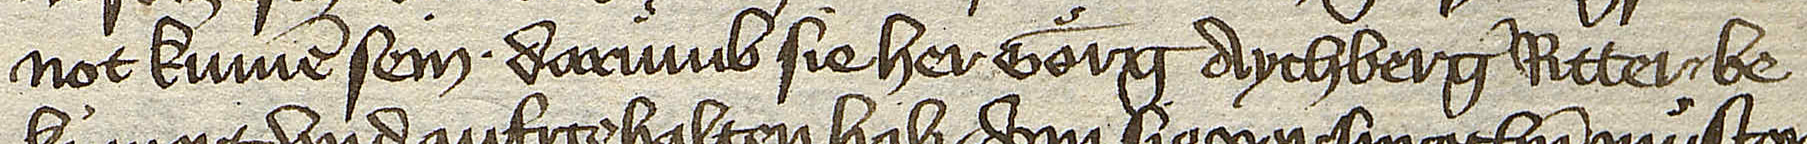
not kume* ſein . Darümb ſie her Görg Aychberg* Ritter / be
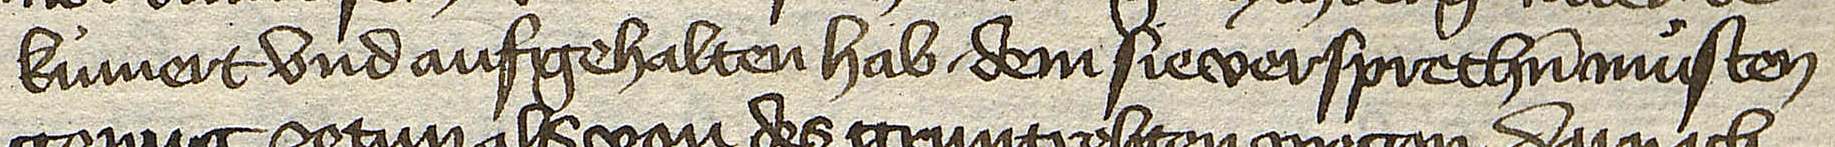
kümert vnd aufgehalten hab / dem ſie verſprechn* müſten
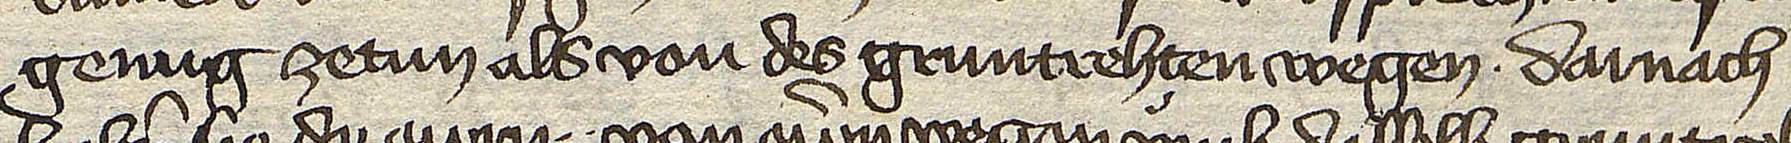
genug cʒetun als von des gruntrehten wegen . Darnach
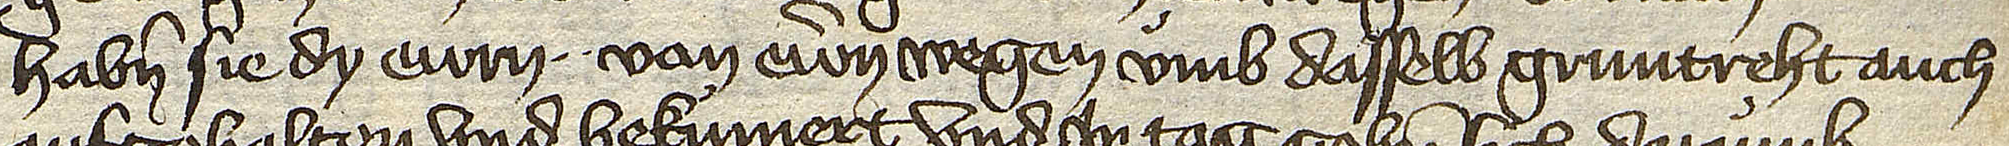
habn* ſie dy ewrn . von ew*n wegen v̈mb daſſelb gruntreht auch
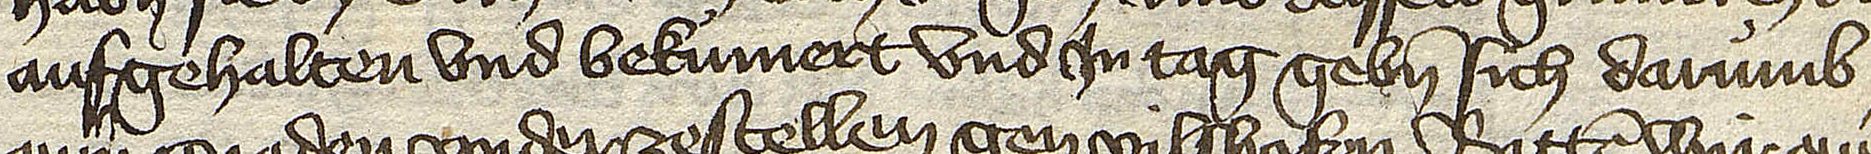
aufgehalten vnd bekümert vnd In tag gebn* ſich darümb
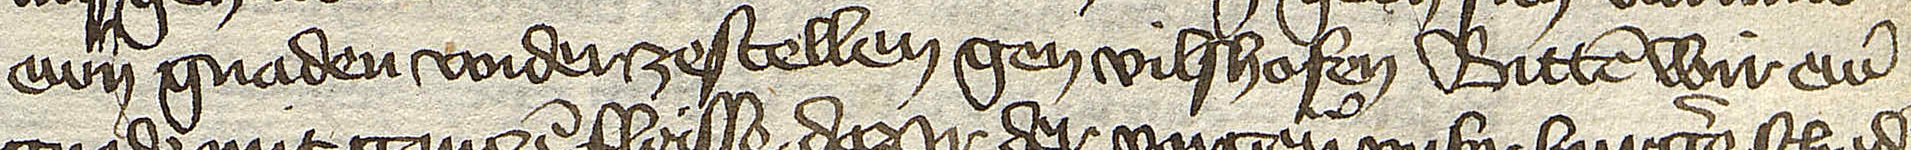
ew*n gnaden vordercʒeſtellen gen vilſhofen Bitte* wir ew*
